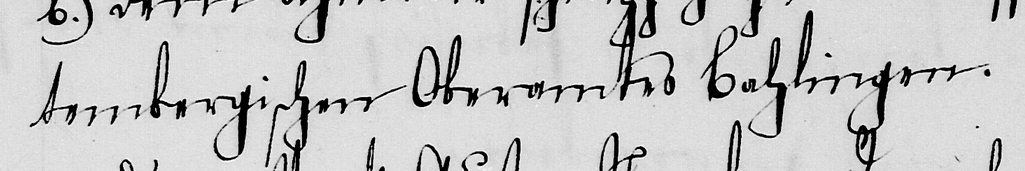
tembergischen Oberamtes Bahlingen.
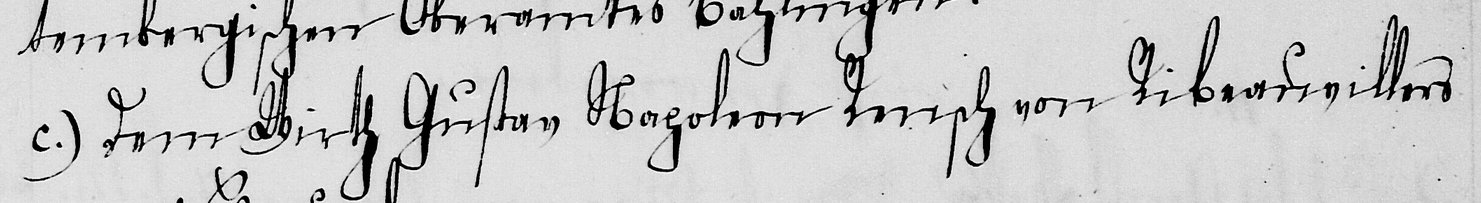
c.) Dem Wirth Gustav Napoleon Rensch von Ribeauvillers
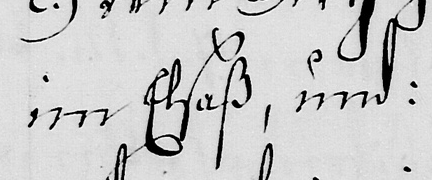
im Elsaß, und:
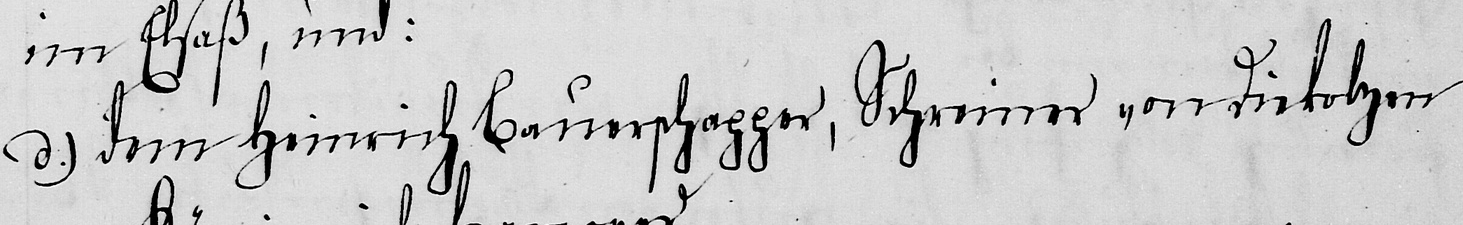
d.) dem Heinrich Bauerschapper, Schreiner von Diekolzen
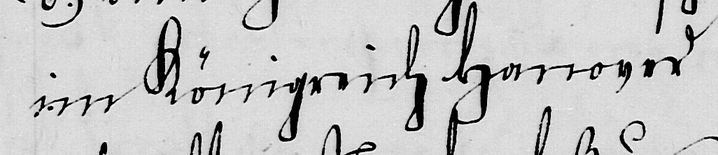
im Königreich Hanover
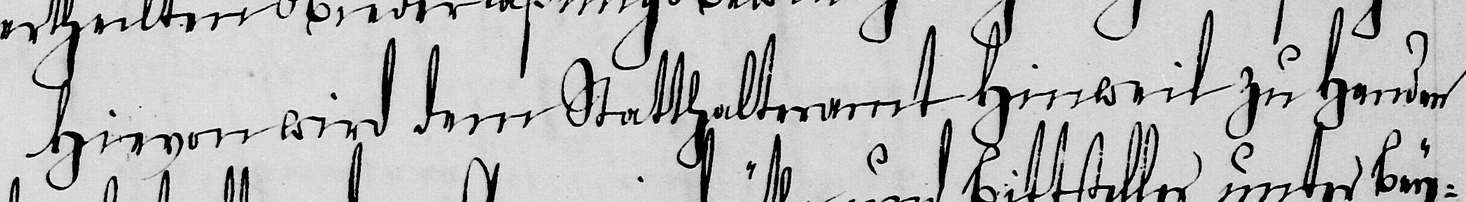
Hievon wird dem Statthalteramt Hinweil zu Handen
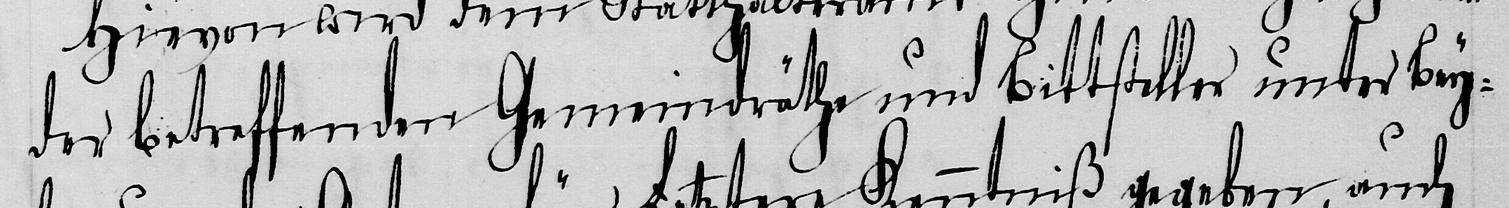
der betreffenden Gemeindräthe und Bittsteller unter Bey¬
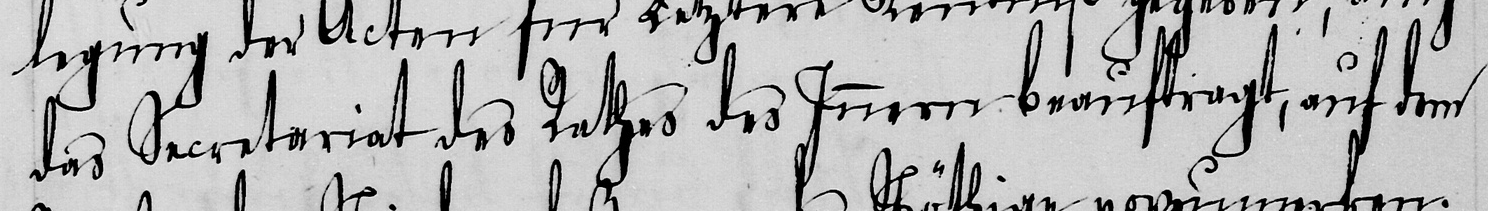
das Secretariat des Rathes des Innern beauftragt, auf dem
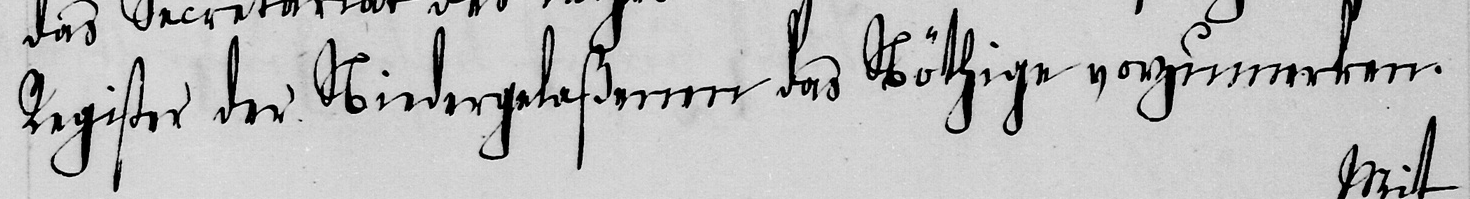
Register der Niedergelaßenen das Nöthige vorzumerken.
